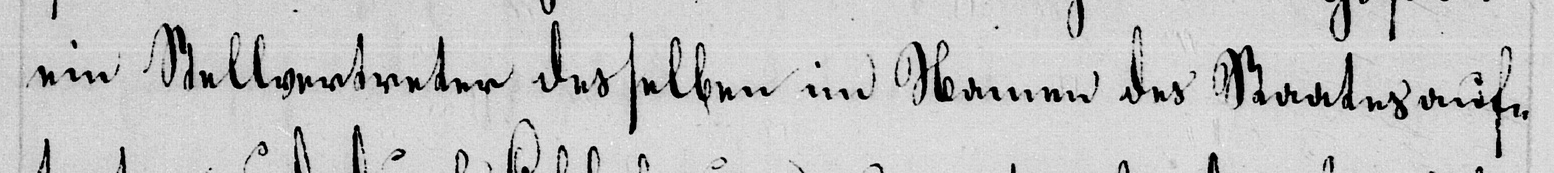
ein Stellvertreter desselben im Namen des Staates auf¬
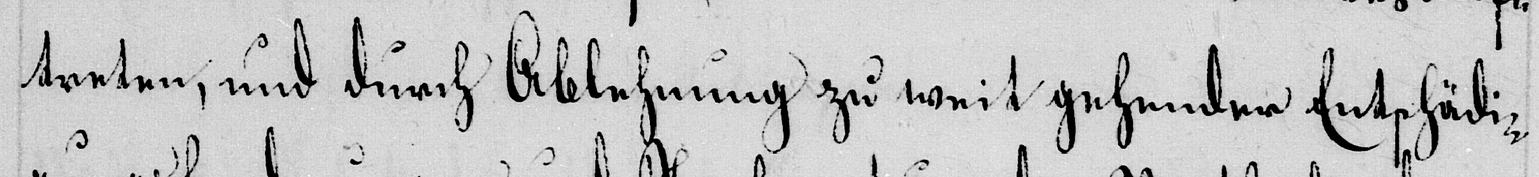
treten, und durch Ablehnung zu weit gehender Entschädi¬
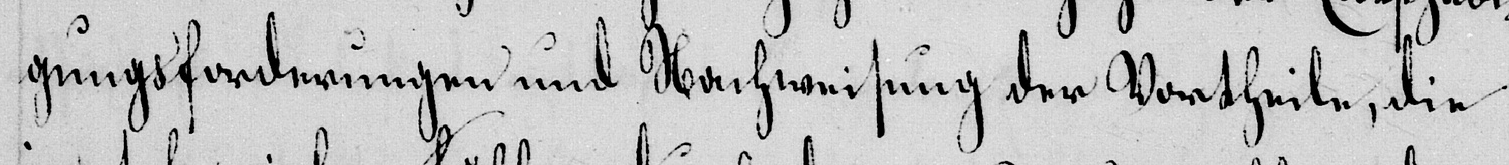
gungsforderungen und Nachweisung der Vortheile, die
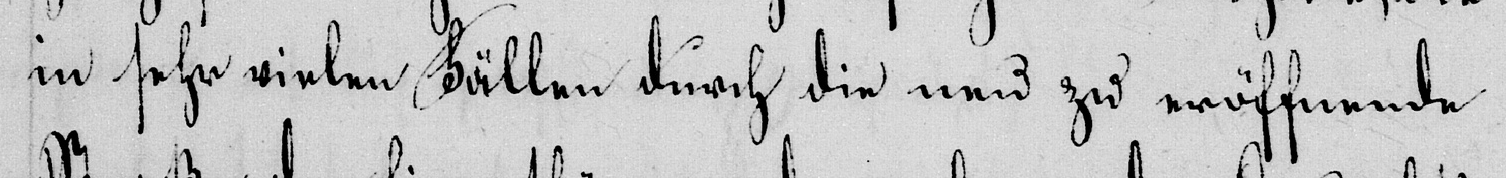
in sehr vielen Fällen durch die neu zu eröffnende
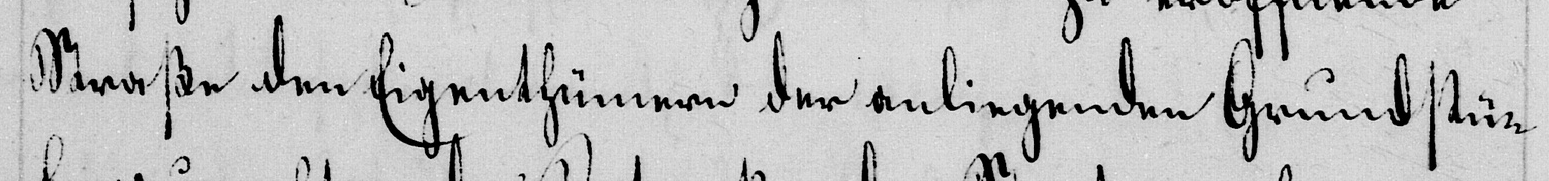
Straße den Eigenthümern der anliegenden Grundstü¬
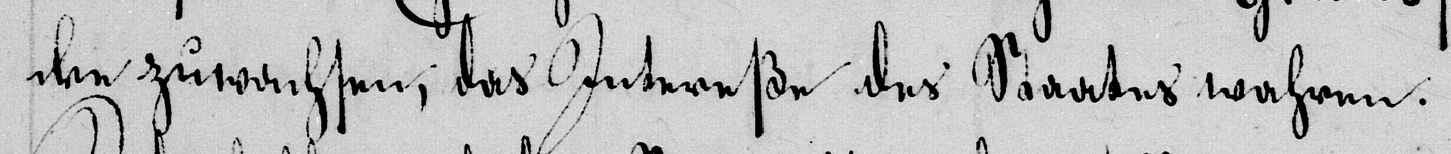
cke zuwachsen, das Intereße des Staates wahren.
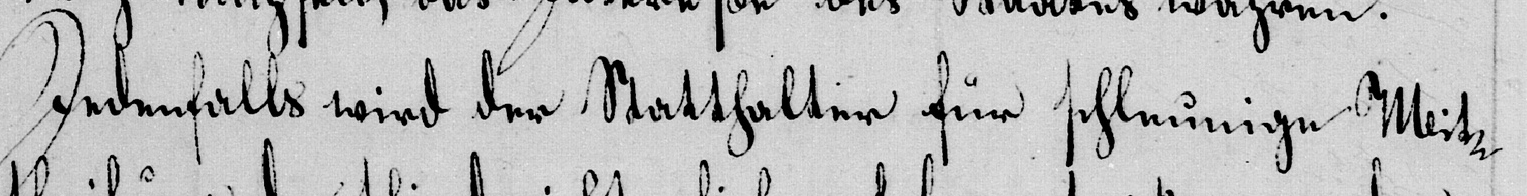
Jedenfalls wird der Statthalter für schleunige Mit¬
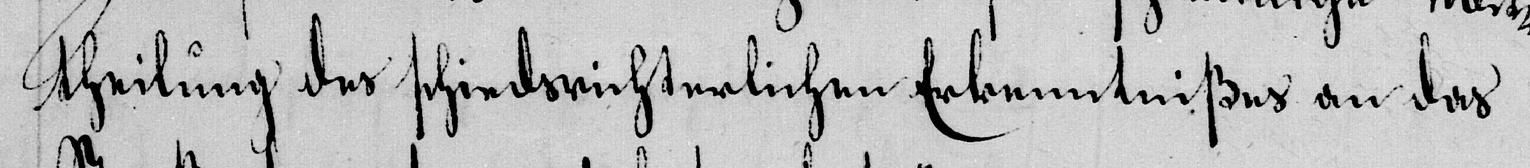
theilung des schiedsrichterlichen Erkenntnißes an das
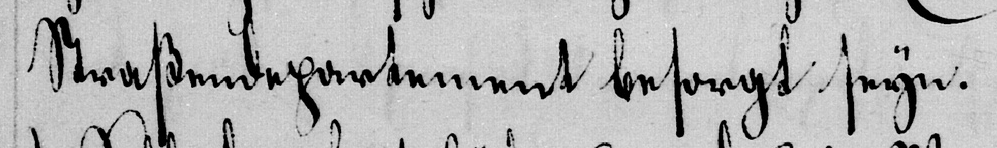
Straßendepartement besorgt seyn.
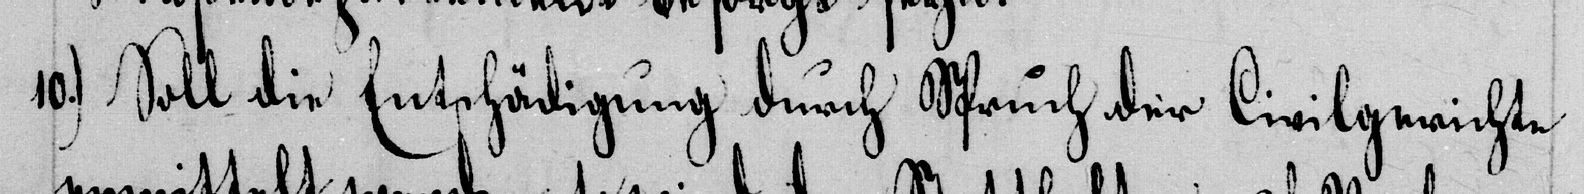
10.) Soll die Entschädigung durch Spruch der Civilgerichte
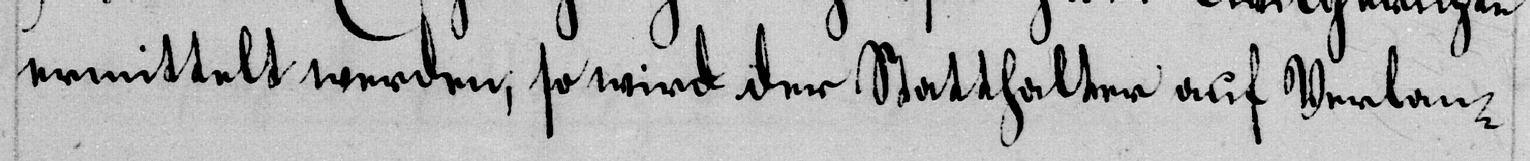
vermittelt werden, so wird der Statthalter auf Verlan-
